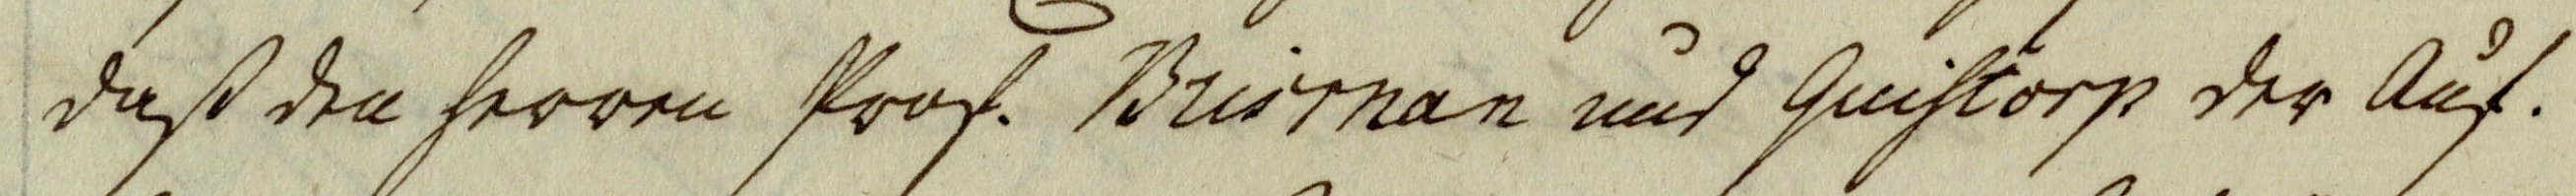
daß den Herren Prof. Brisman und Quistorp der Auf¬
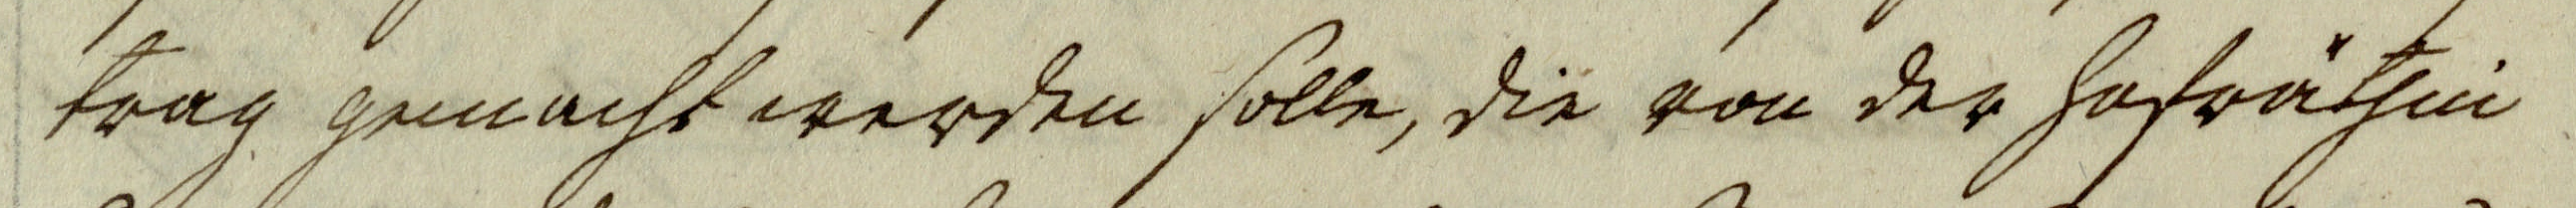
trag gemacht werden solle, die von der Hofräthin
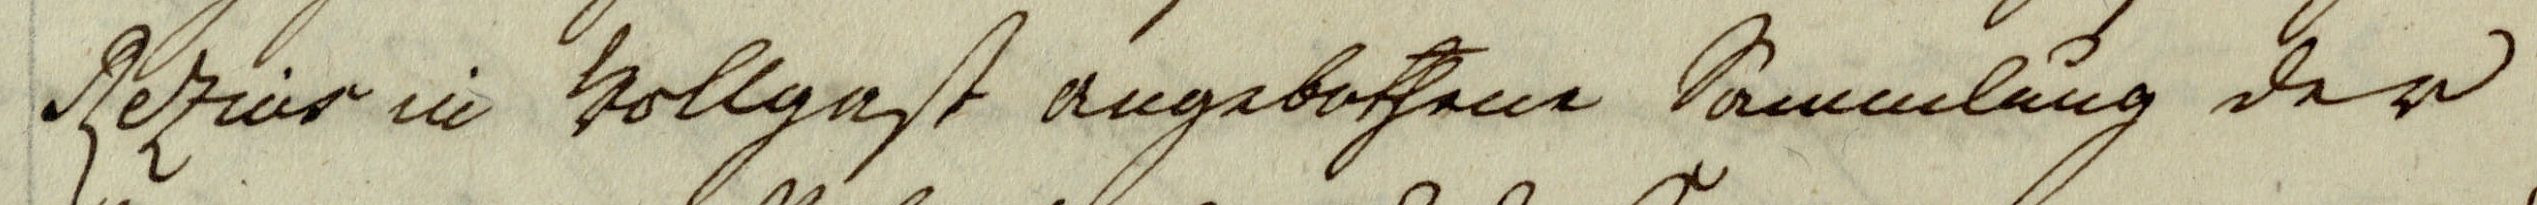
Rezius in Wollgast angebothene Sammlung der
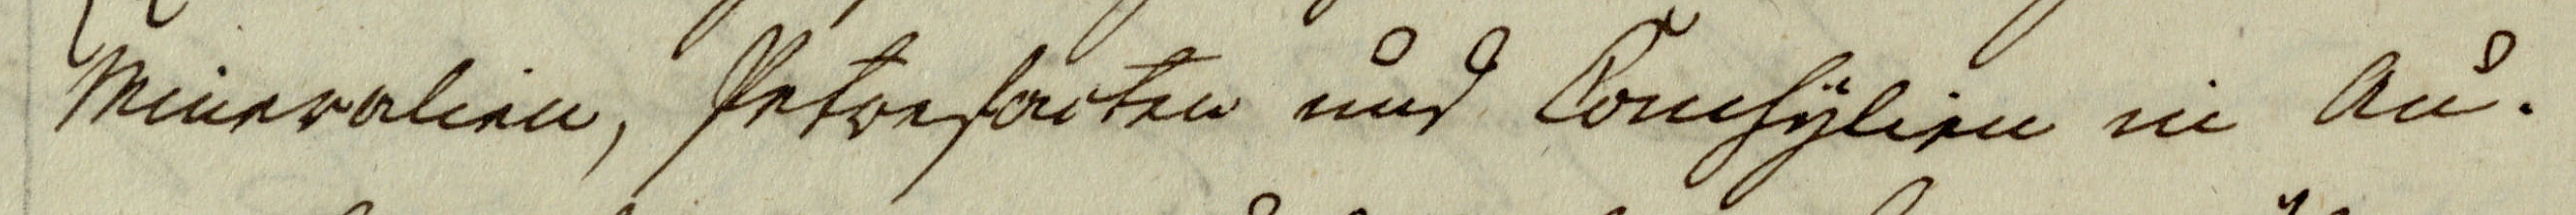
Mineralien, Petrefacten und Conchÿlien in Au¬
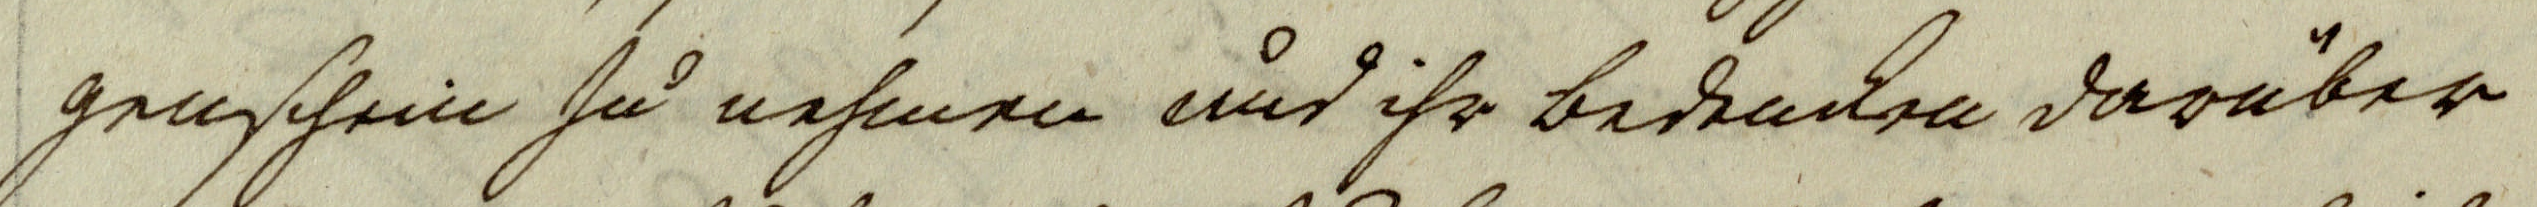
genschein zu nehmen und ihr Bedencken darüber
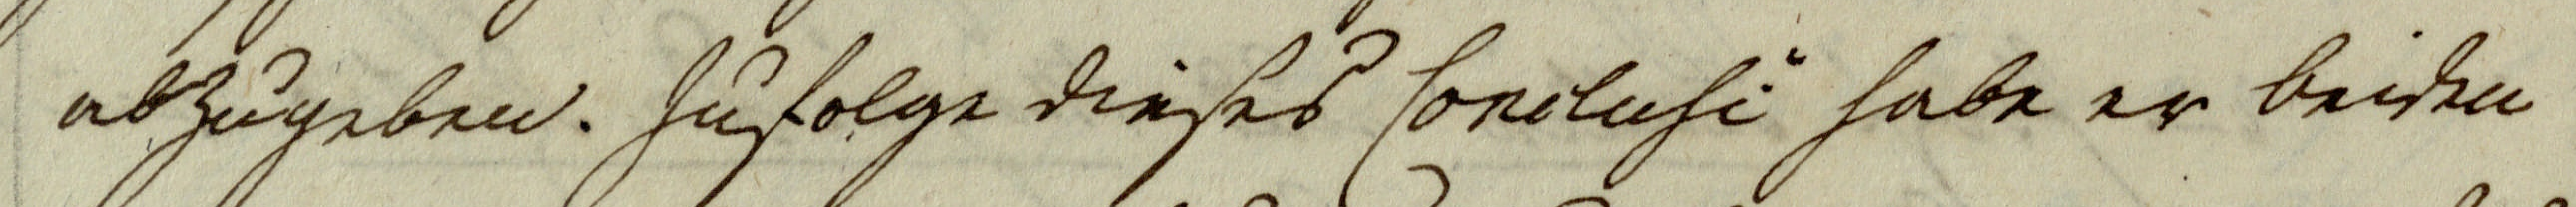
abzugeben. Zufolge dieses Conclusi habe er beiden
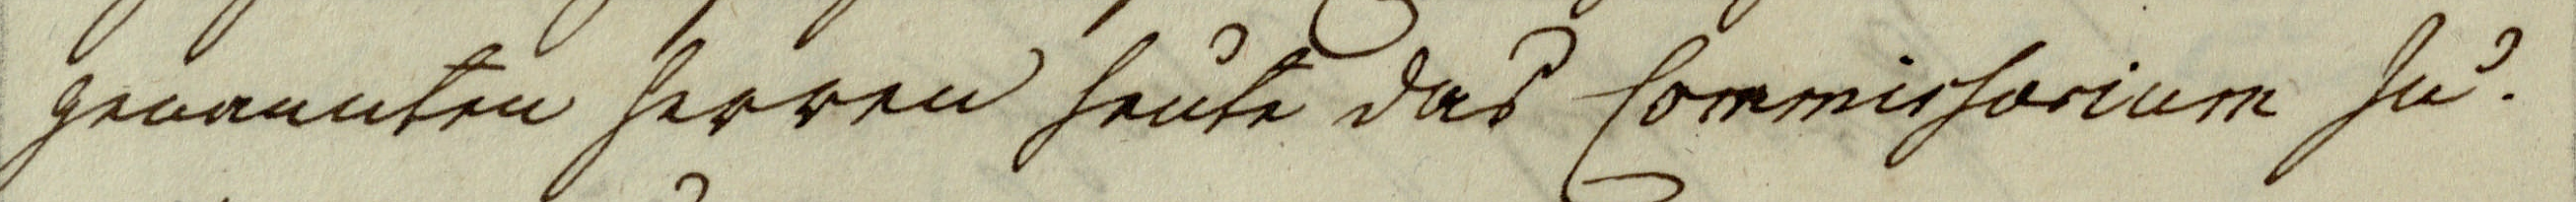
genannten Herren heute das Commissorium zu¬
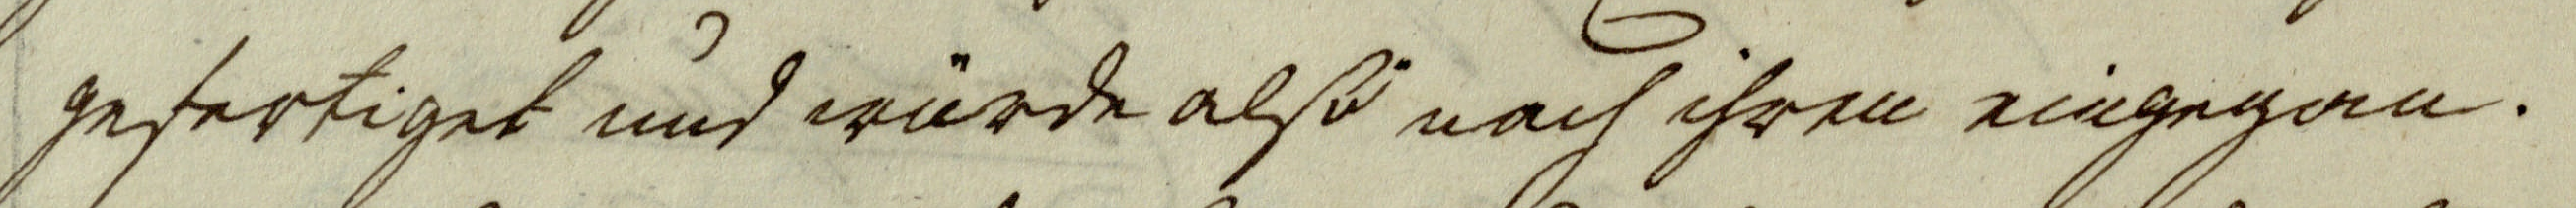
gefertiget und würde also nach ihren eingegan¬
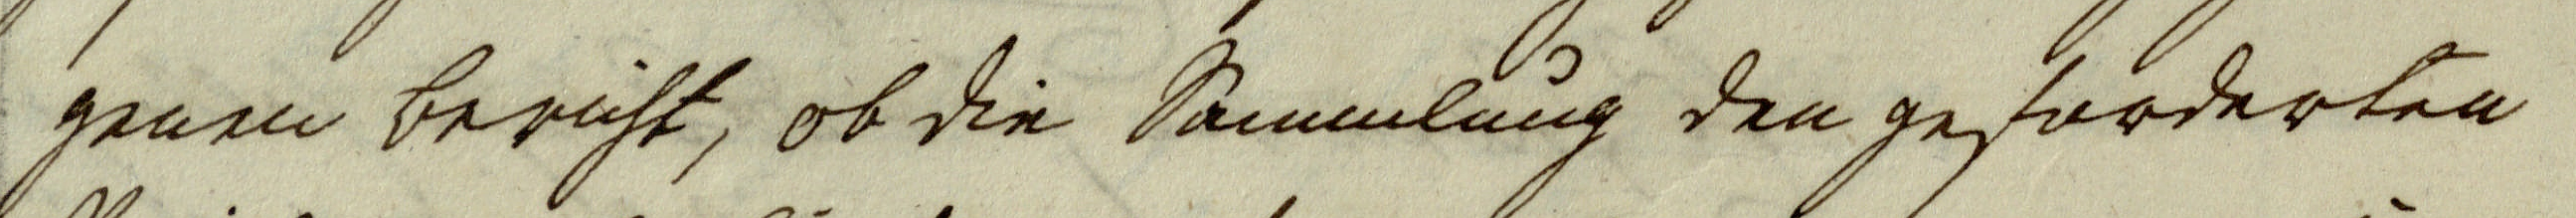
genen Bericht, ob die Sammlung den geforderten
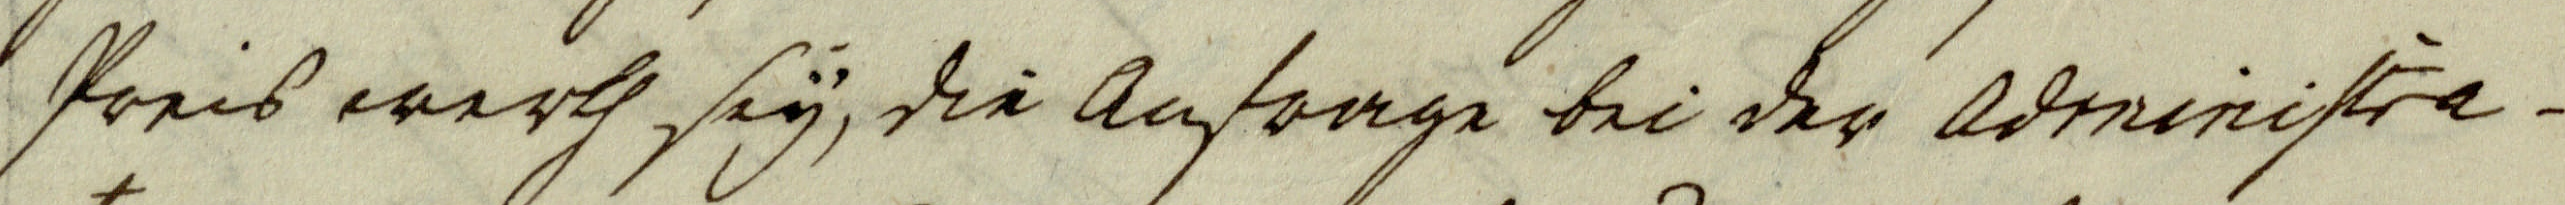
Preis werth seÿ, die Anfrage bei der Administra¬
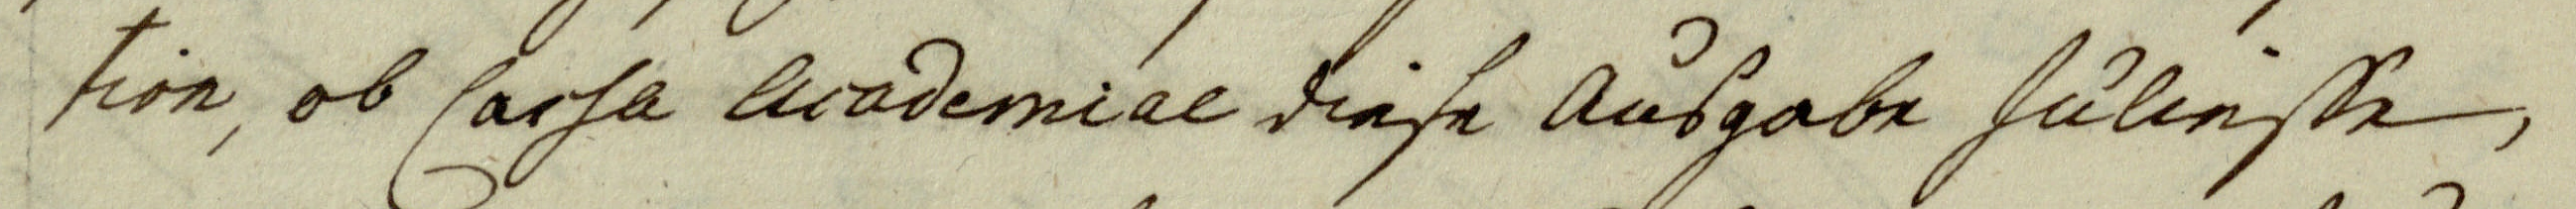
tion, ob Cassa Academica diese Ausgabe zuliesse,
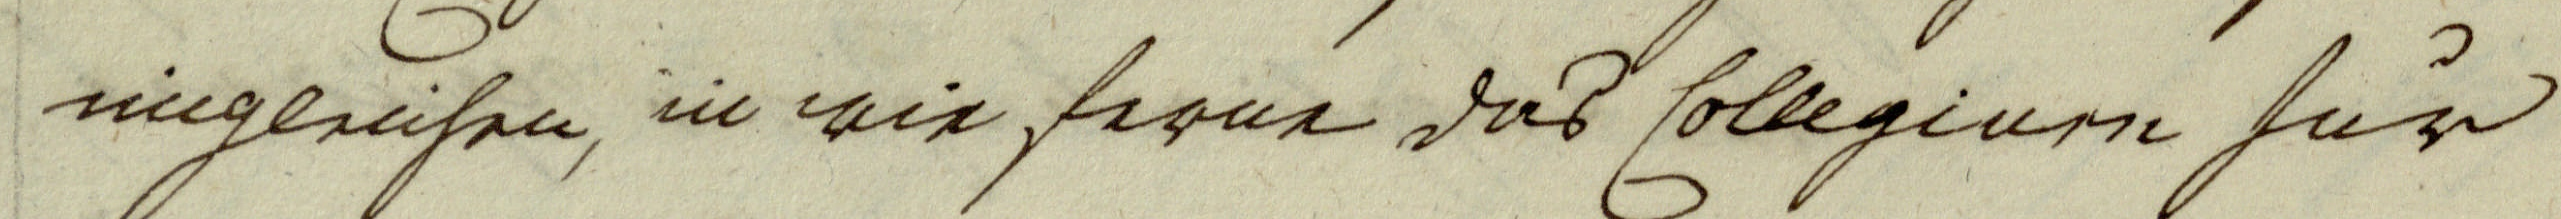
eingleichen, in wie ferne das Collegium zur
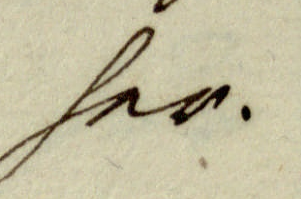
her¬
